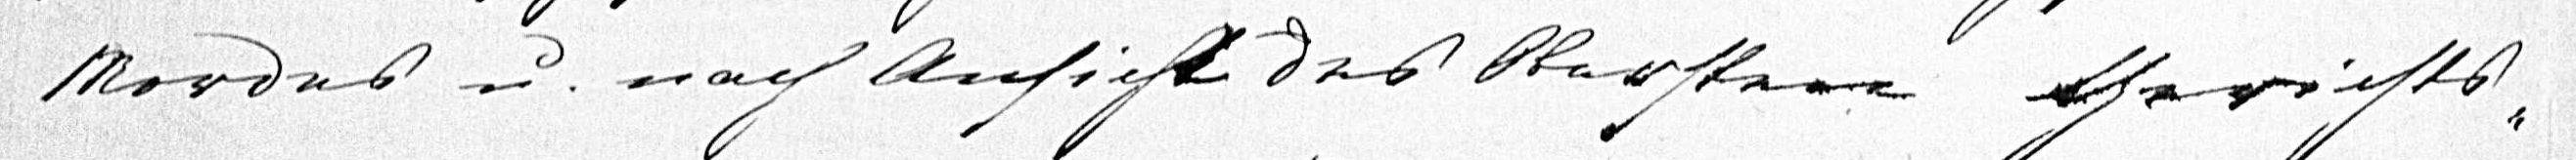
mordes u. nach Ansicht des Obersten Gerichts¬
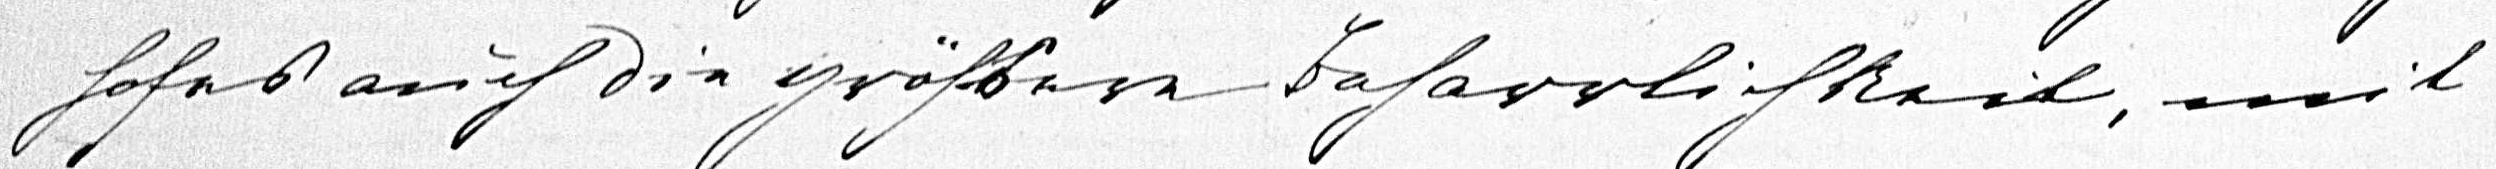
hofes auch die größere Beharrlichkeit, mit
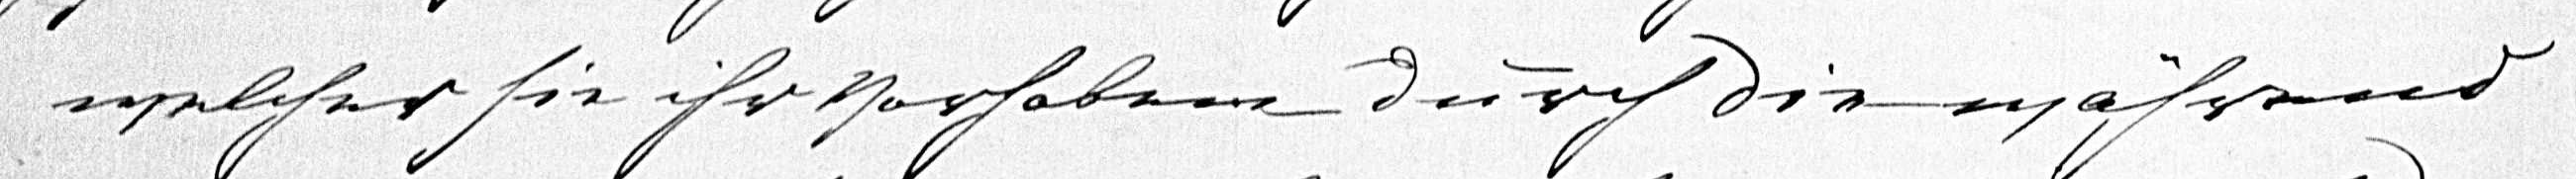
welcher sie ihr Vorhaben durch die während
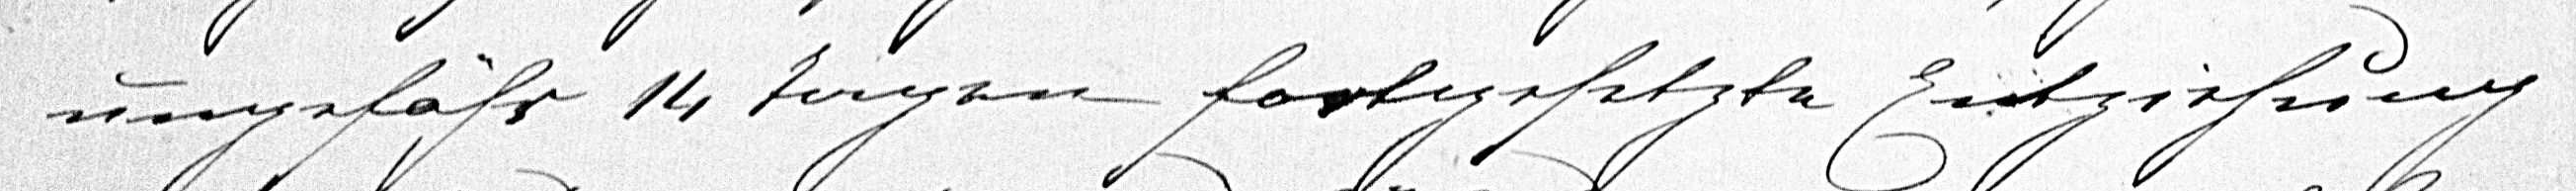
ungefähr 14 Tagen fortgesetzte Entziehung
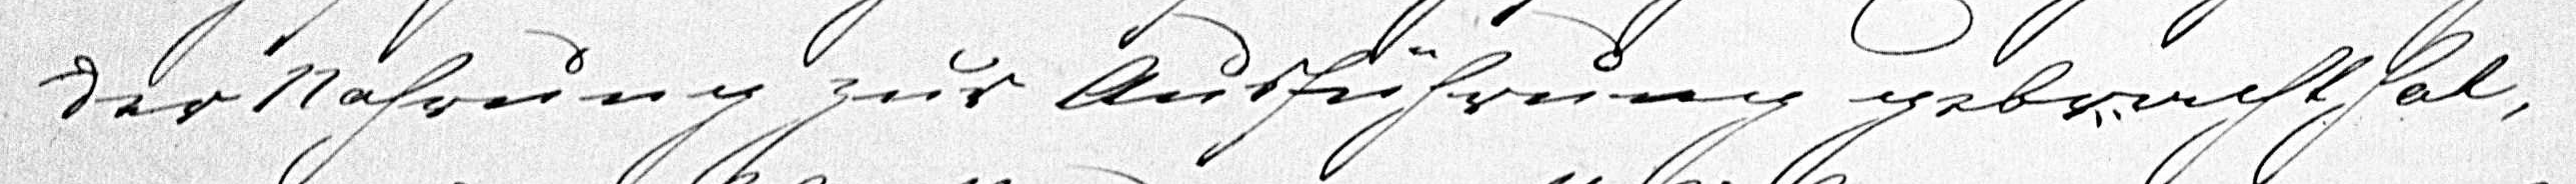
der Nahrung zur Ausführung gebracht hat,
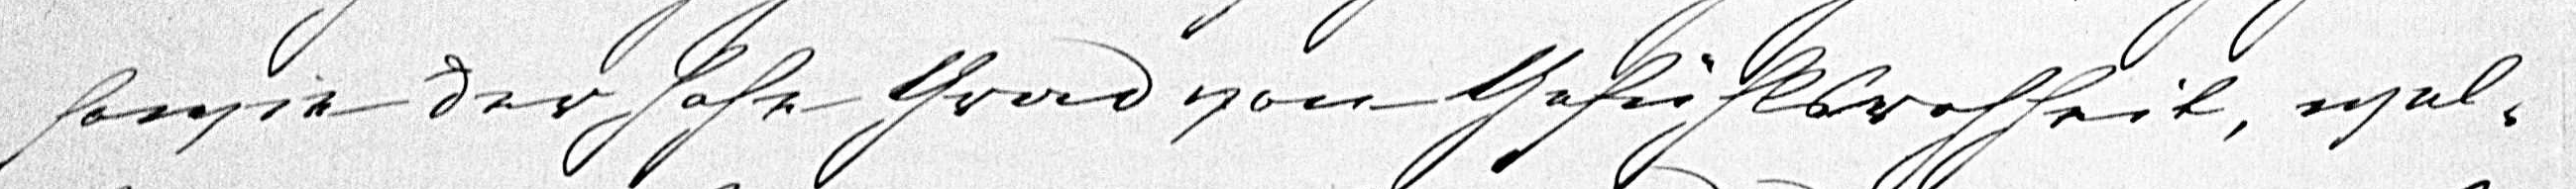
sowie der hohe Grad von Gefühlsrohheit, wel¬
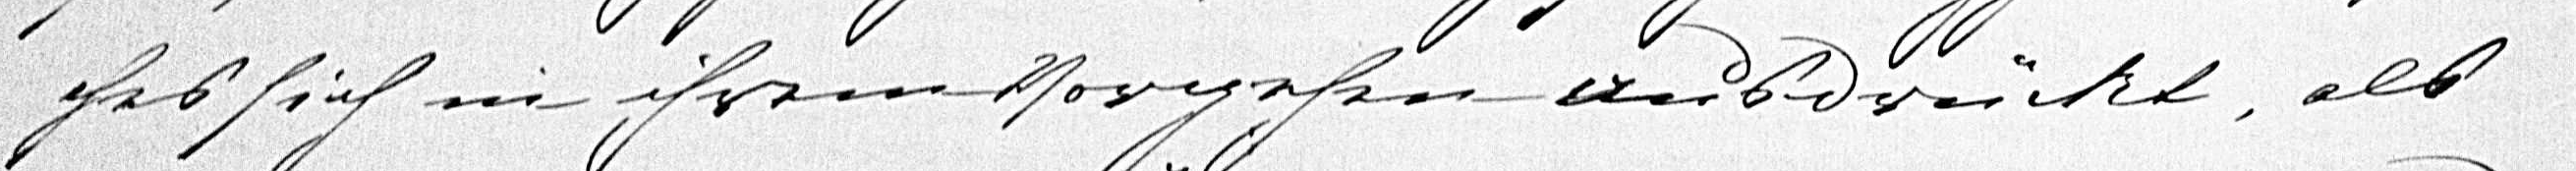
ches sich in ihrem Vorgehen ausdrückt, als
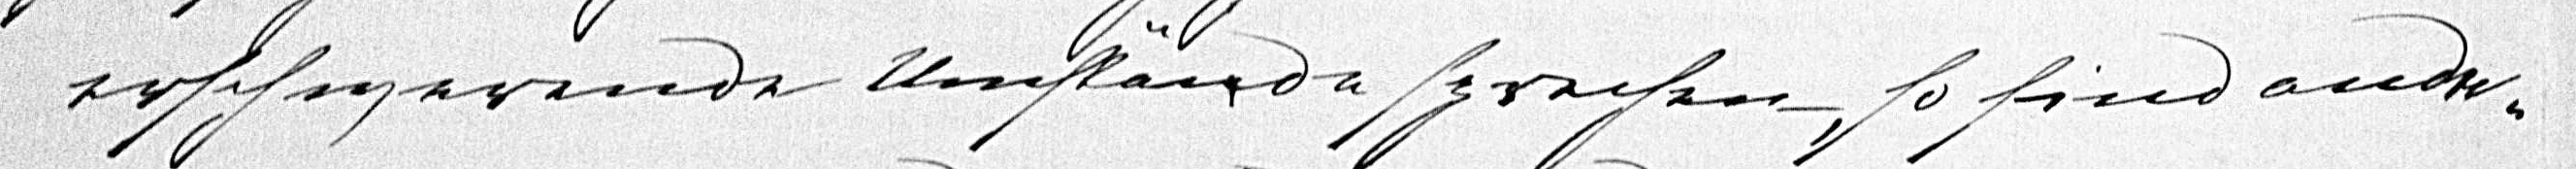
erschwerende Umstände sprechen, so sind ande¬
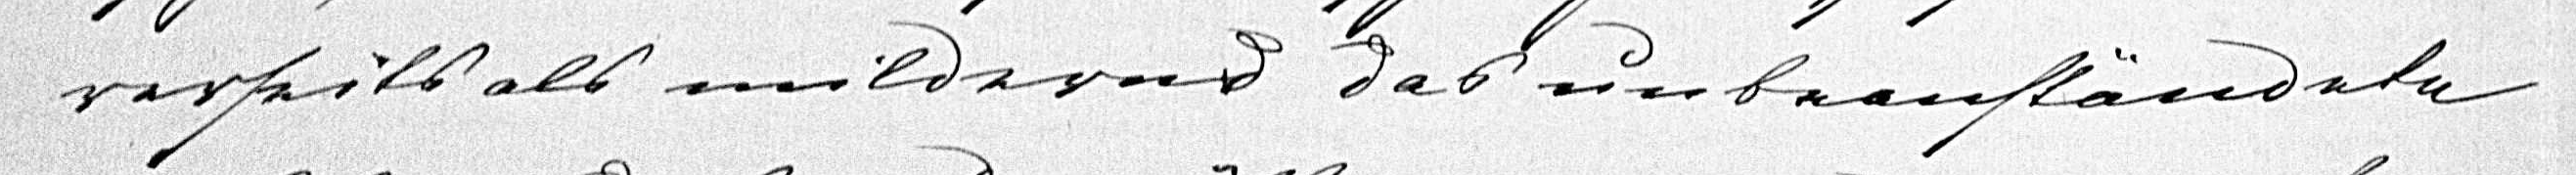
rerseits als mildernd das unbeanständete
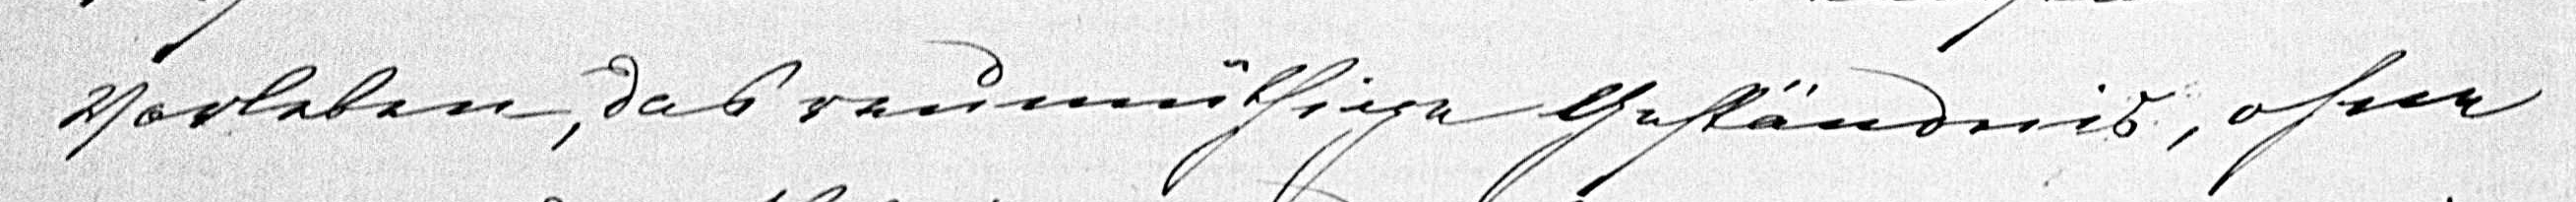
Vorleben, das reumüthige Geständnis, ohne
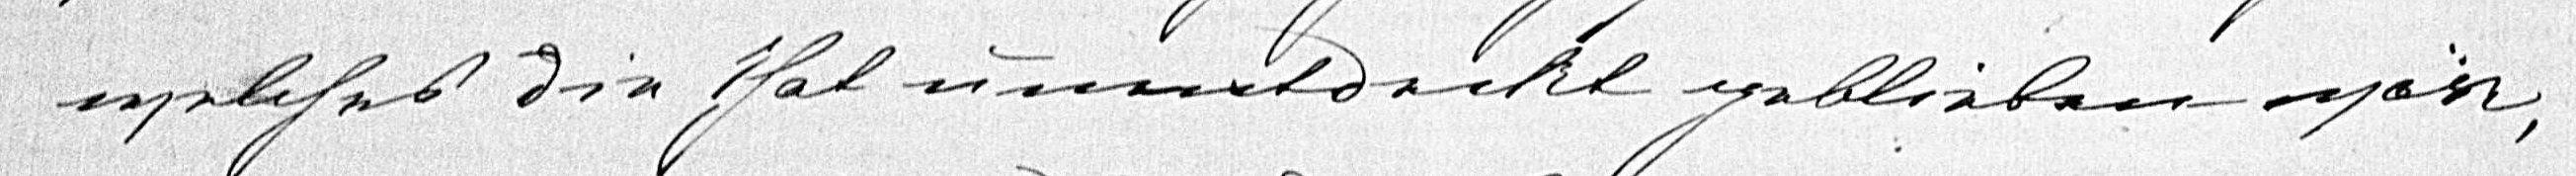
welches die That unentdeckt geblieben wäre,
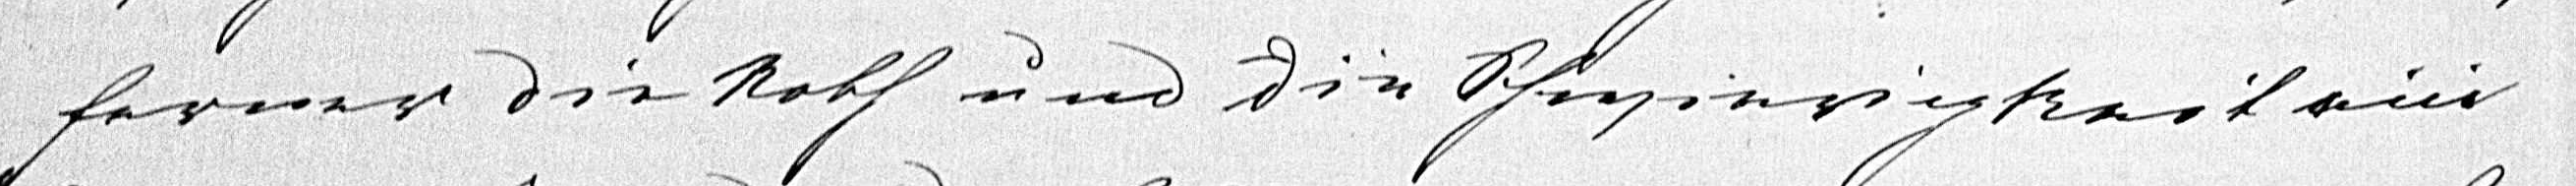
ferner die Noth und die Schwierigkeit ein
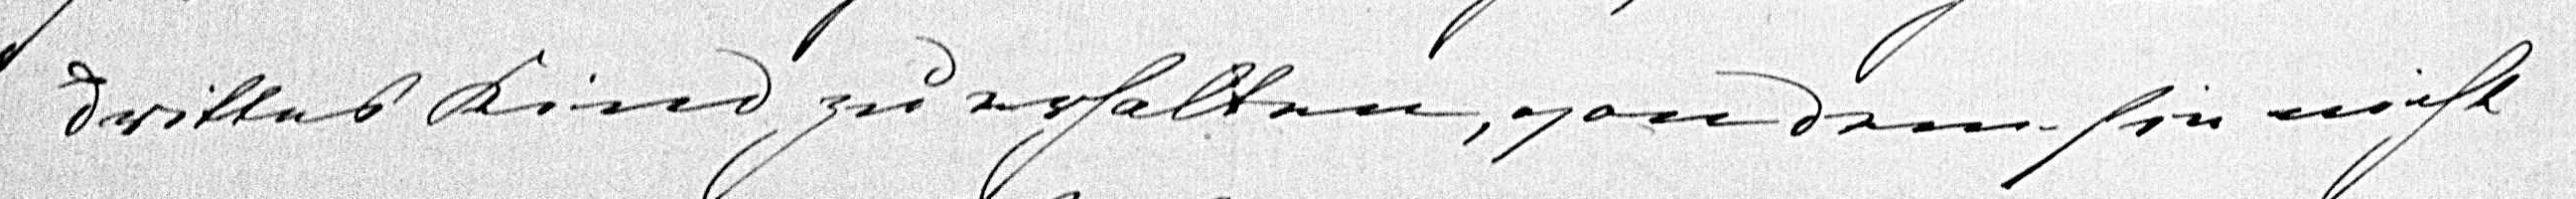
drittes Kind zu erhalten, von dem sie nicht
